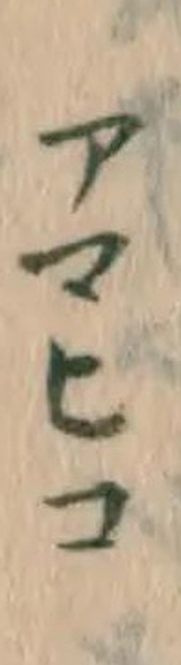アマヒコ
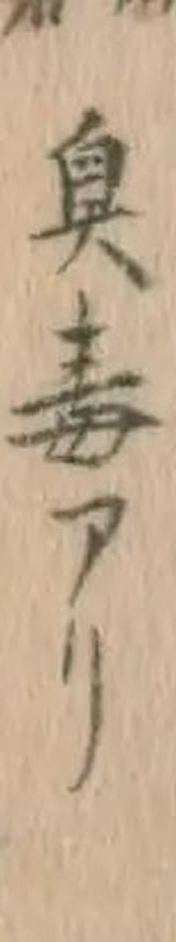臭毒アリ
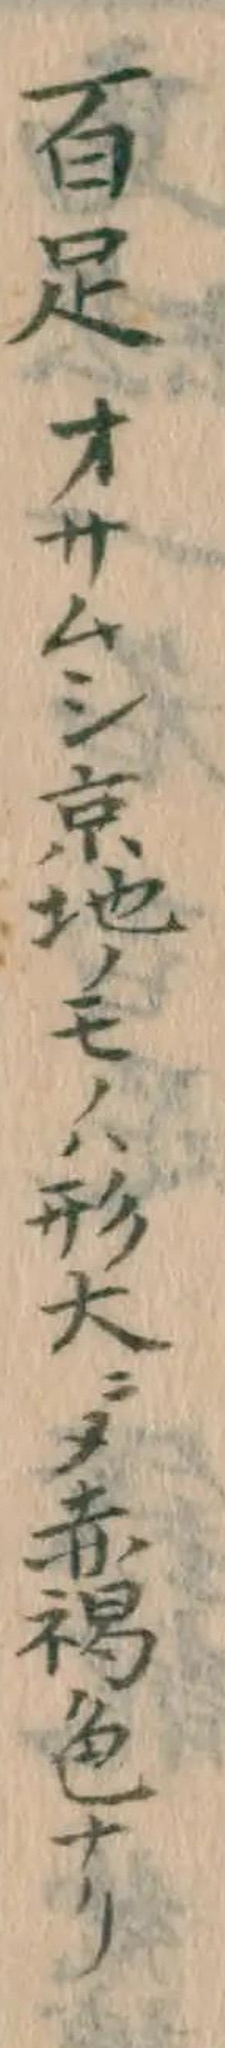百足オサムシ京地ノモノハ形大ニシテ赤褐色ナリ
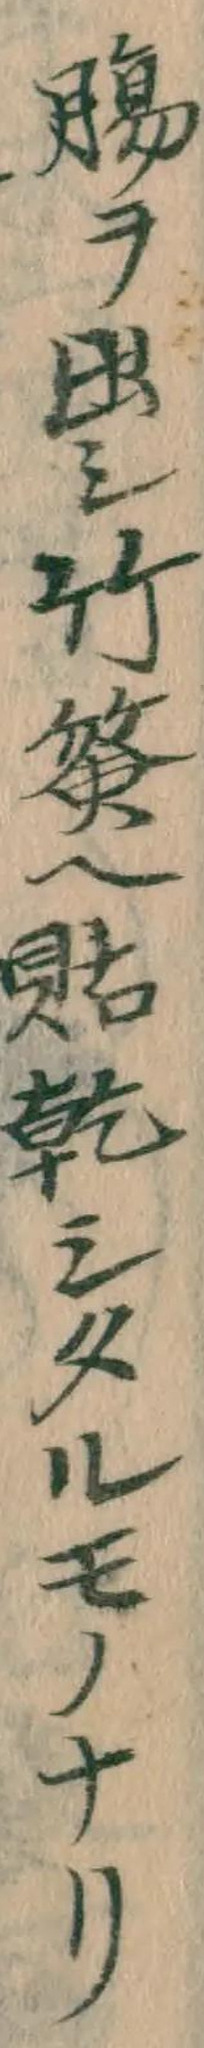蜈蚣膓ヲ出シ竹簽ヘ貼乾シタルモノナリ
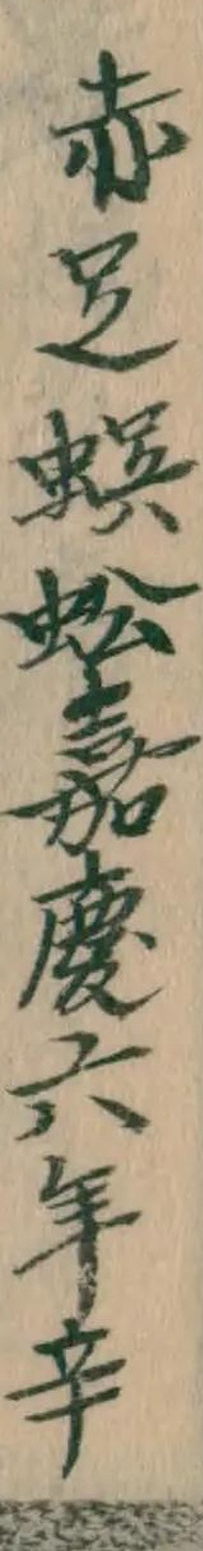赤足蜈蚣嘉慶六年辛
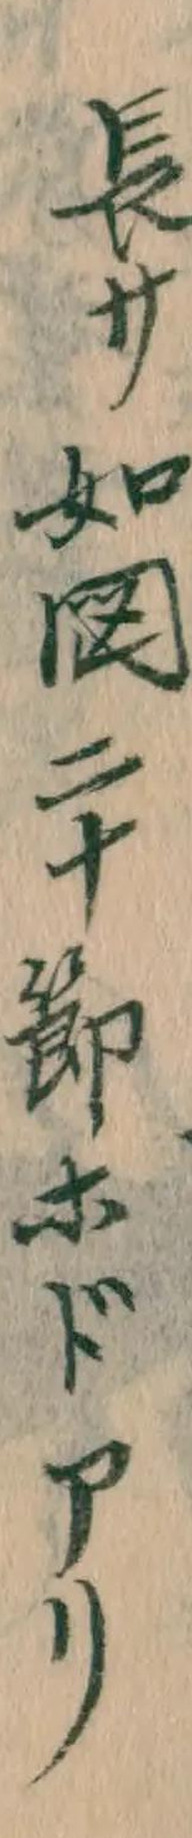長さ如図二十節ホドアリ
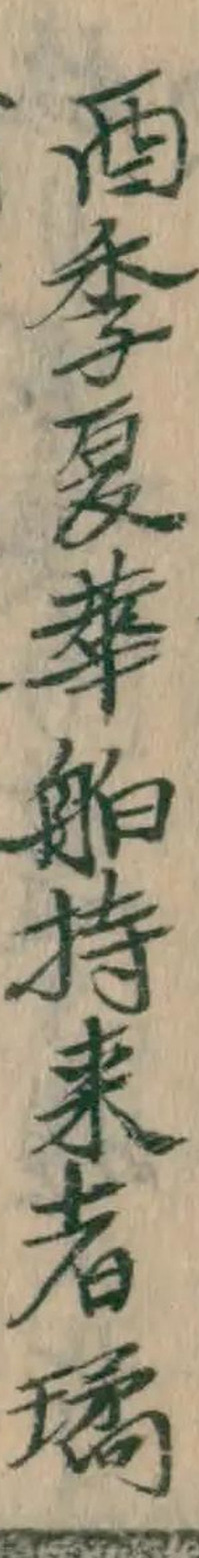酉季夏華舶持来者璚
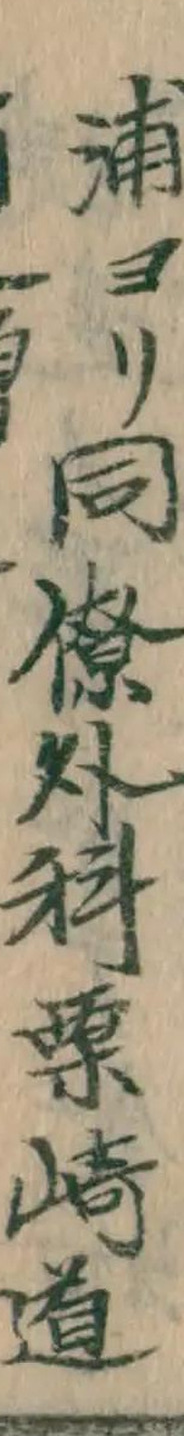浦ヨリ同僚外科栗崎道
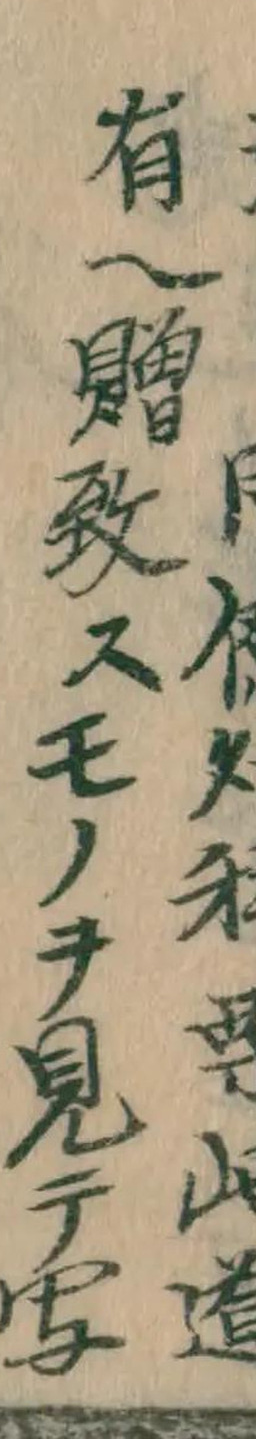有ヘ贈致スモノヲ見テ写
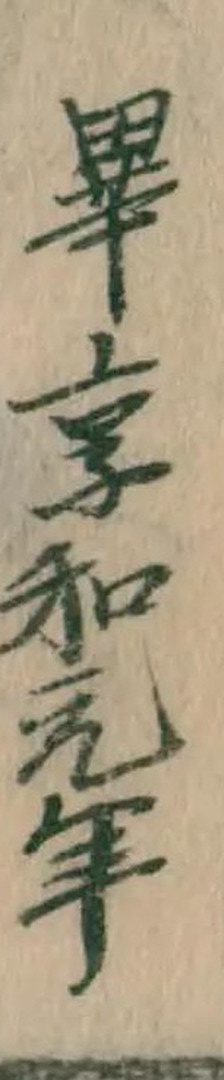畢京和元年
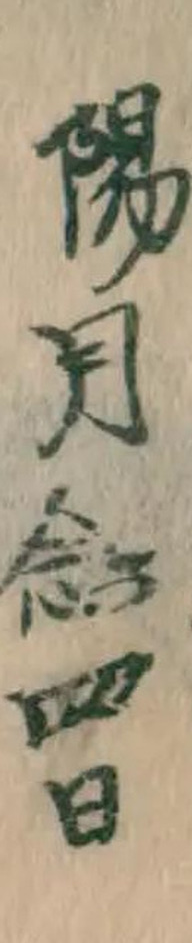陽月念四日
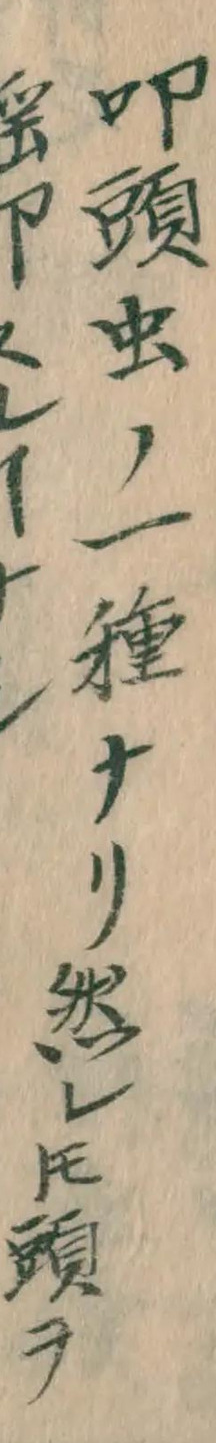叩頭虫ノ一種ナリ然レトモ頭ヲ
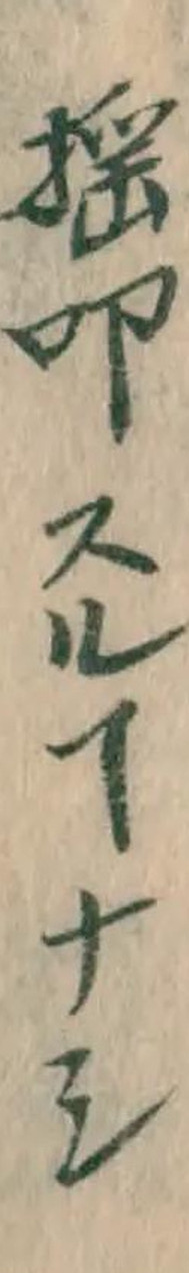揺叩スルコトナシ
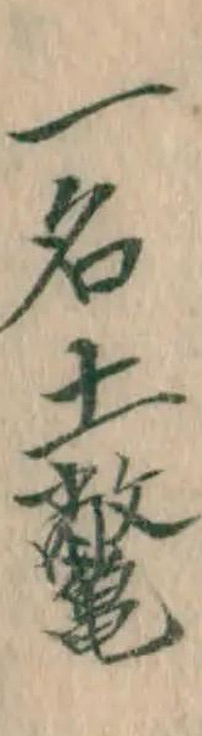一名土鼈

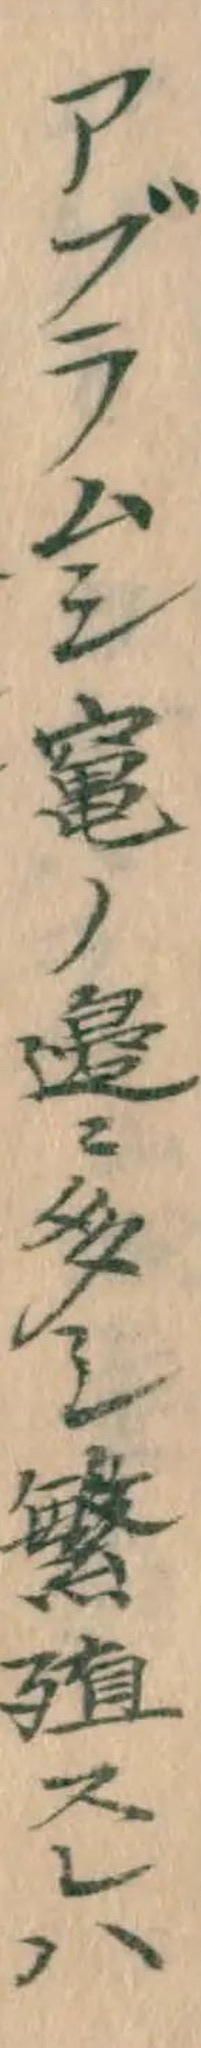アブラムシ竃ノ邉ニ多シ繁殖スレハ
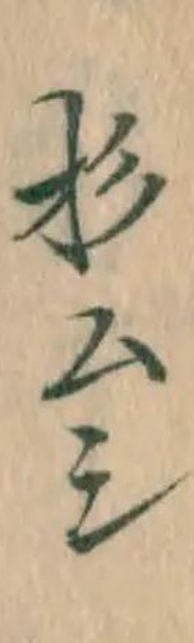杉ムシ
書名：千蟲譜 3巻. [1]
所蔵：国立国会図書館 National Diet Library, JAPAN
